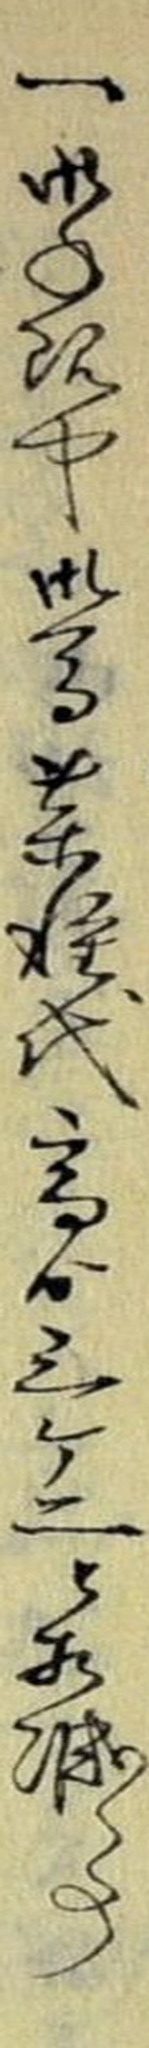一御年限中御馬薬種代高ゟ三ケ二被相減事
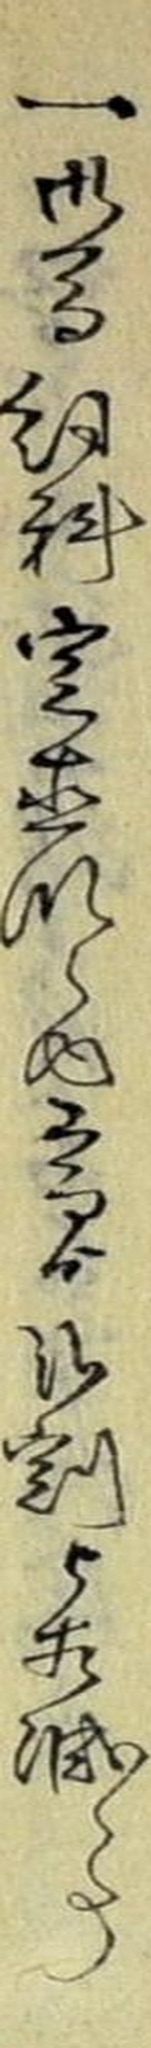一御馬飼料定直段之内高ゟ弐割被相減事
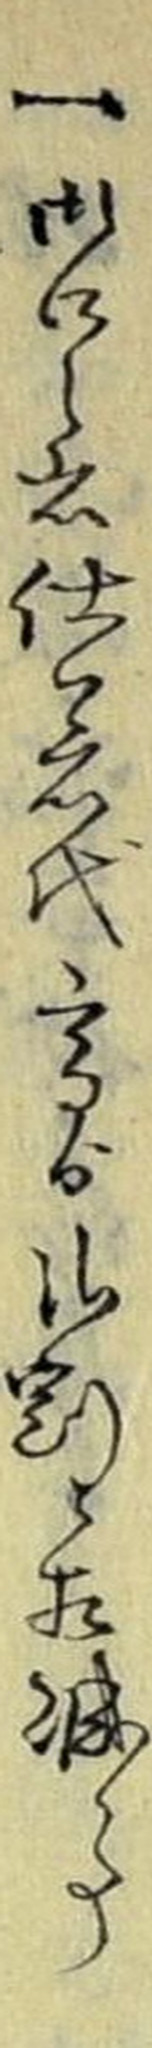一御口之者仕着代高ゟ弐割被相減事
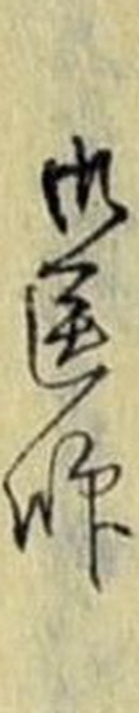御医師
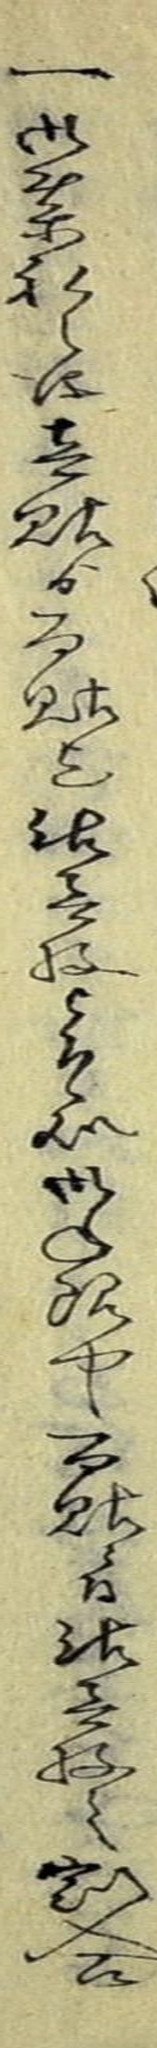一御薬礼之儀壱貼ゟ百貼迄銀壱枚被下候処御年限中百貼ニ付銀壱枚之割合
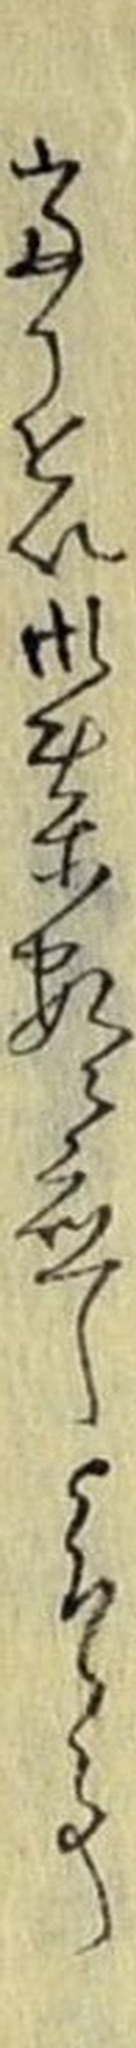当りを以御薬数ニ応し被下候事
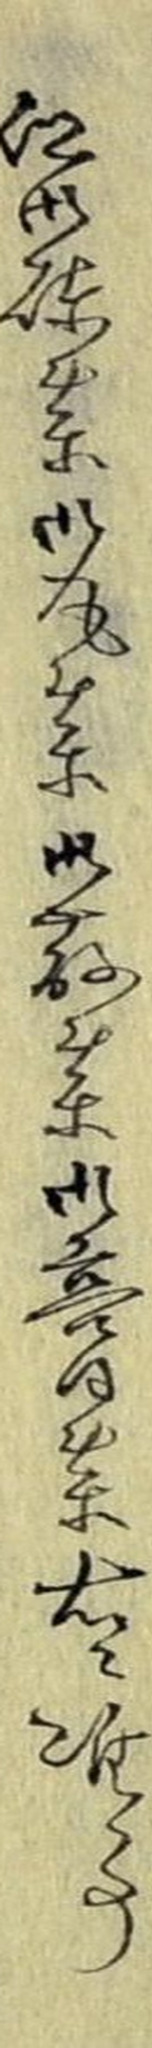但御砕薬御丸薬御散薬御膏薬右ニ准事
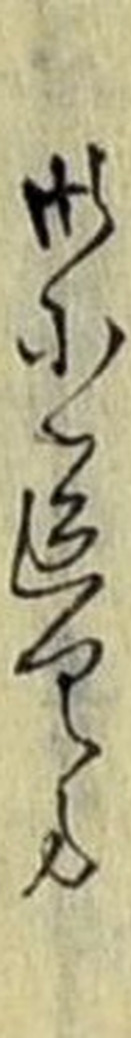御小道具方
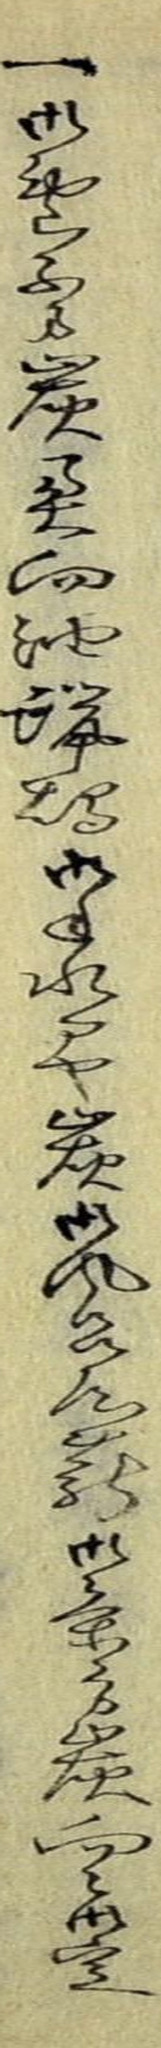一御台子方炭奥向油蝋燭御手水部ヤ炭御風呂屋薪御茶方炭向々御定
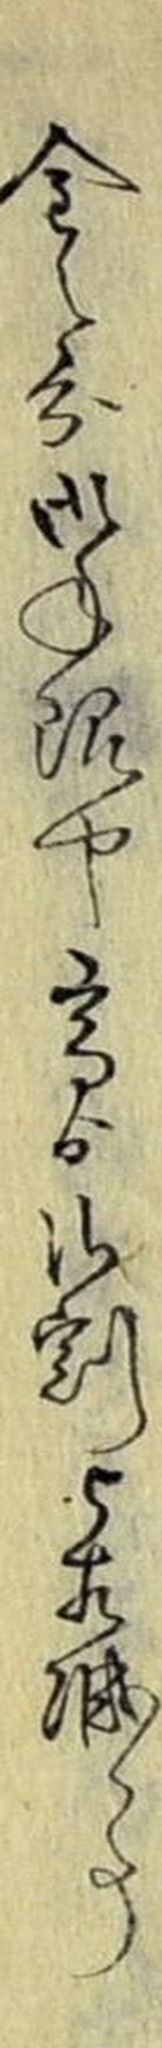金之分御年限中高ゟ弐割被相減事
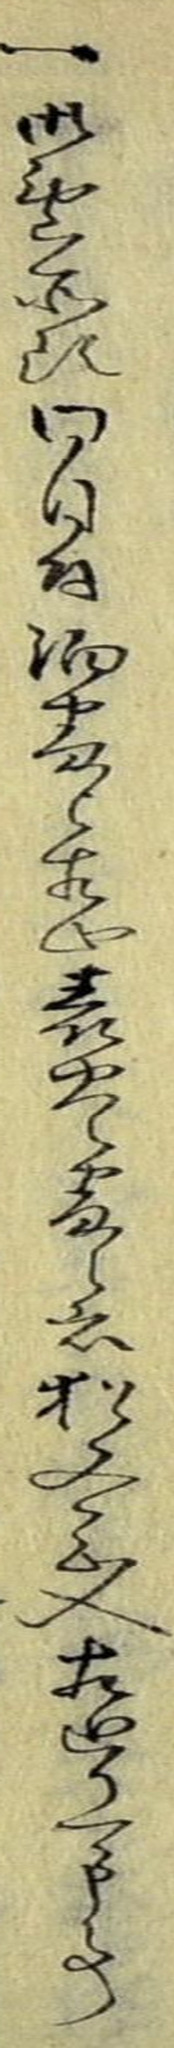一御台所頭同目付泊番被相止表火之番之者猶又念入相廻り可申事

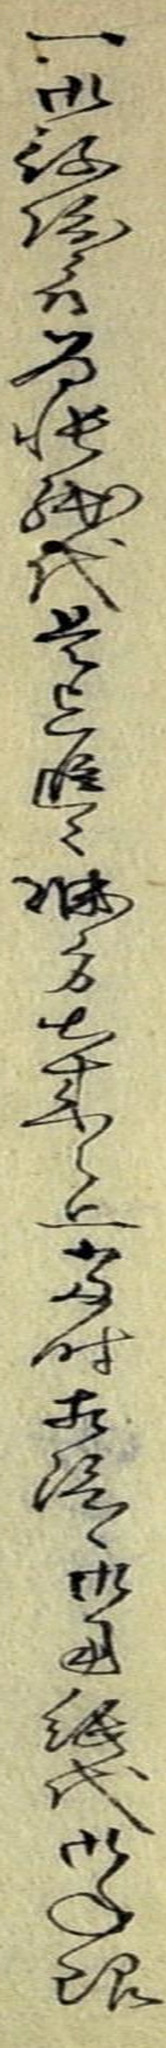一御役儀ニ付為帳紙代是迄追々減方出来之上当時相渡候御用紙代御年限
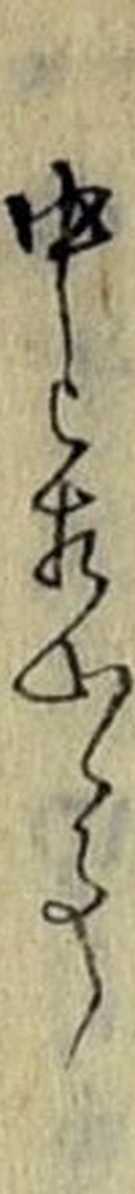中被相止候事
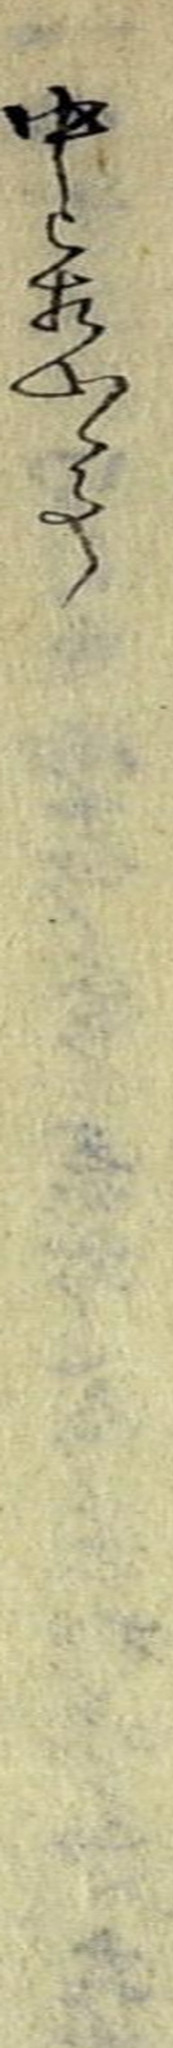中被相止候事
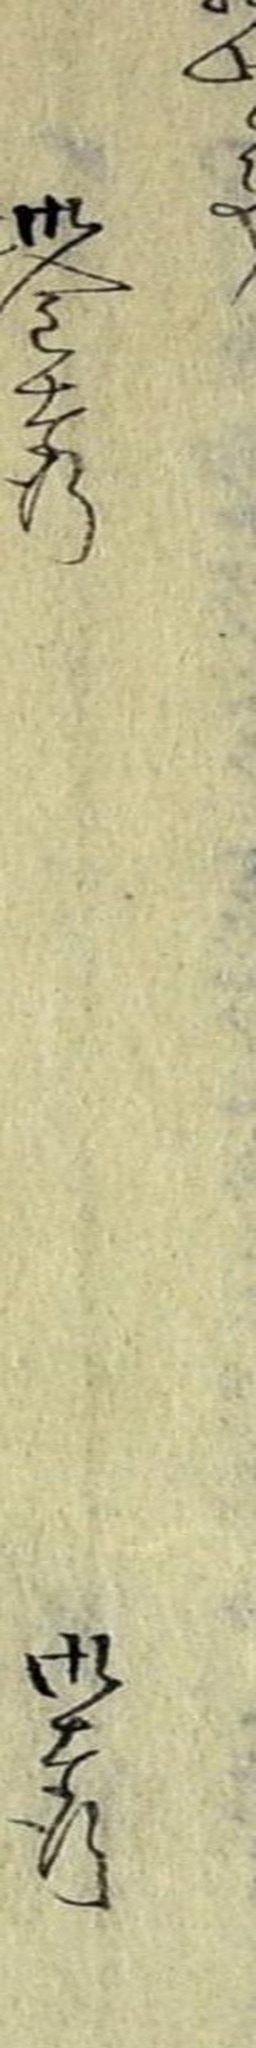御金奉行御奉行
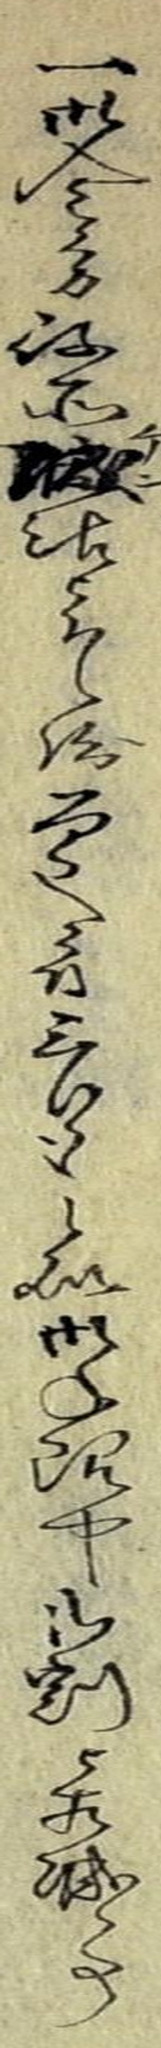一御金方役所減銀被下之儀百匁ニ付三歩ツヽ之処御年限中弐割被相減事
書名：命令之部 五
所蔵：福井県文書館 Fukui Prefectural Archives
